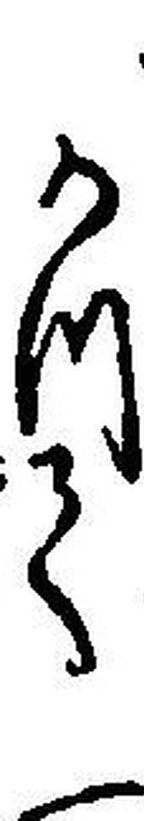かつて
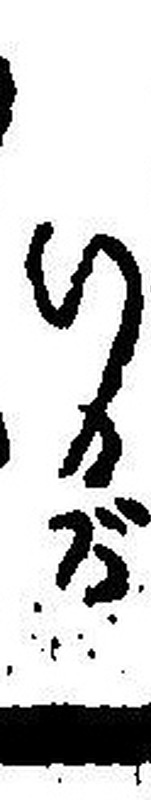いるか
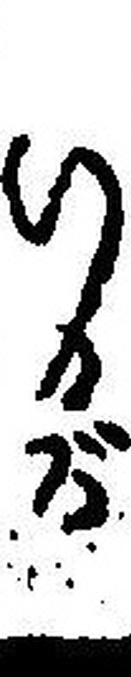いるか
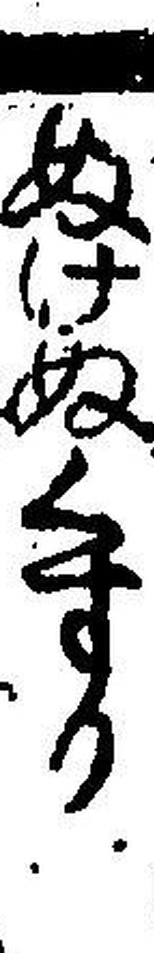ぬけぬくすり
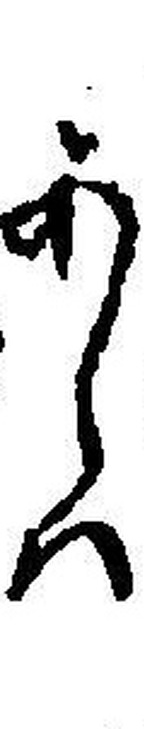あしは
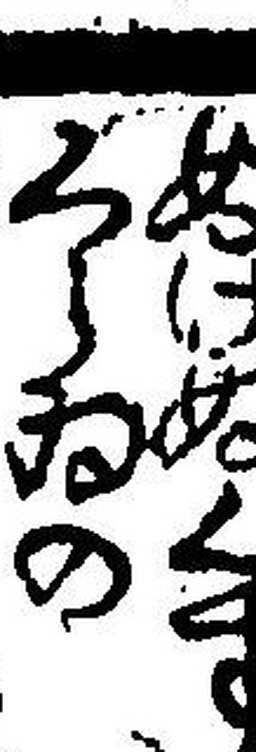くらゐの
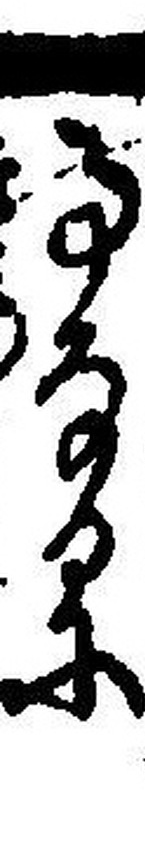事なるに
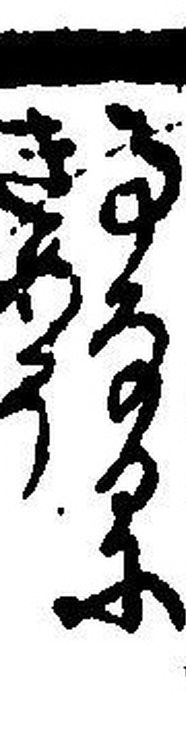きめう
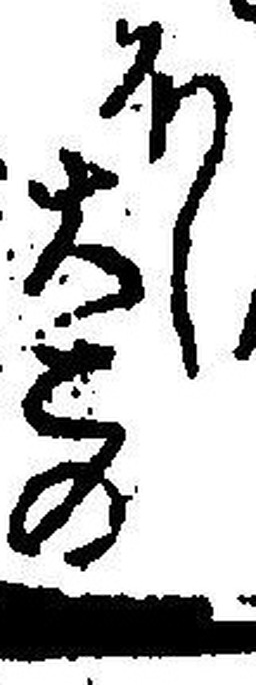大この
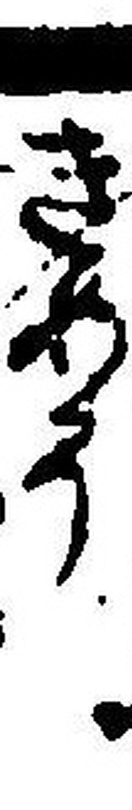きめう
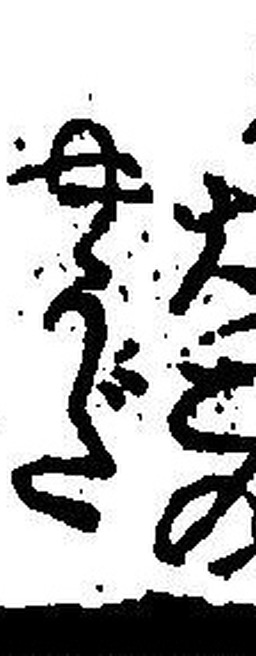やうだ
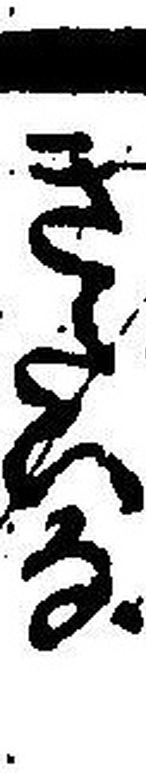きたいな
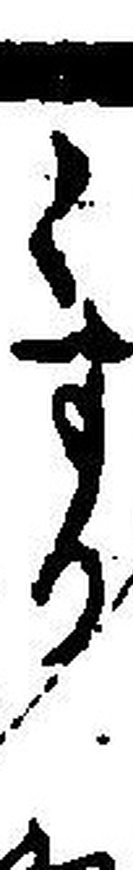くすり
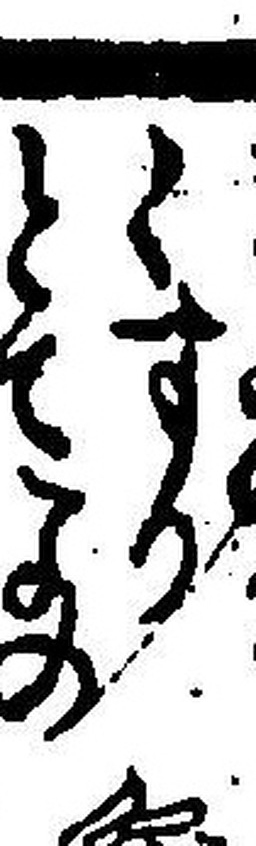とてよの
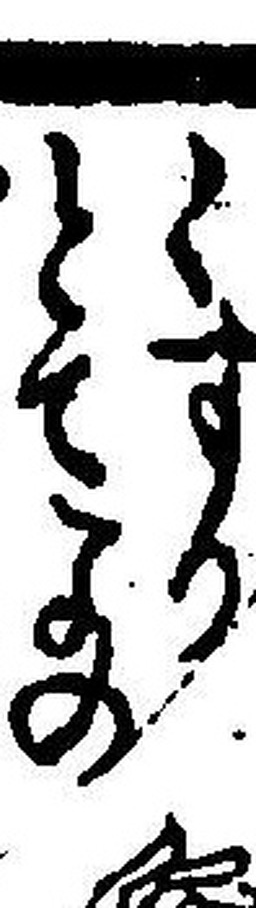とてよの
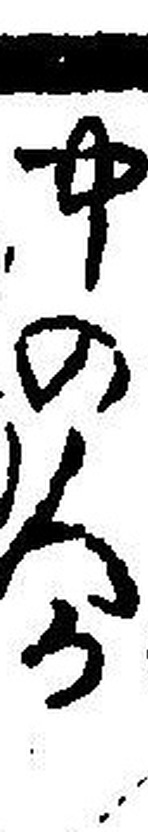中の人か
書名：徳若水縁起金性 / 樹下石上作
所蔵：東京大学総合図書館 General Library in the University of Tokyo, JAPAN
